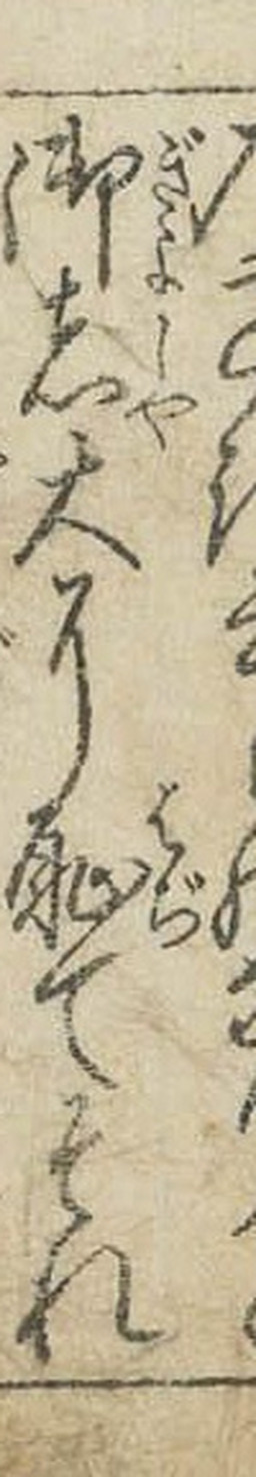御者大に恥てそれ
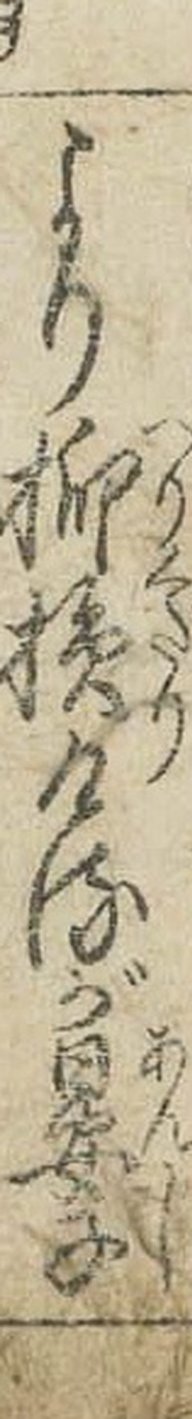より抑損けるが晏子
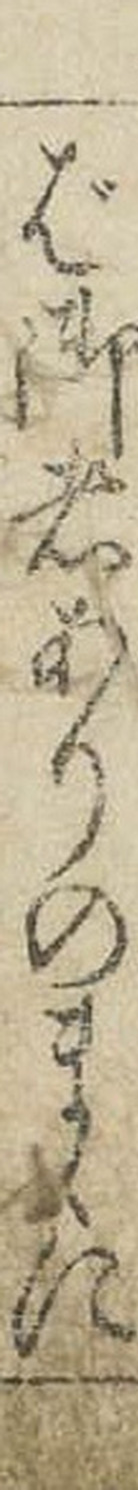ば御者ありのまゝに
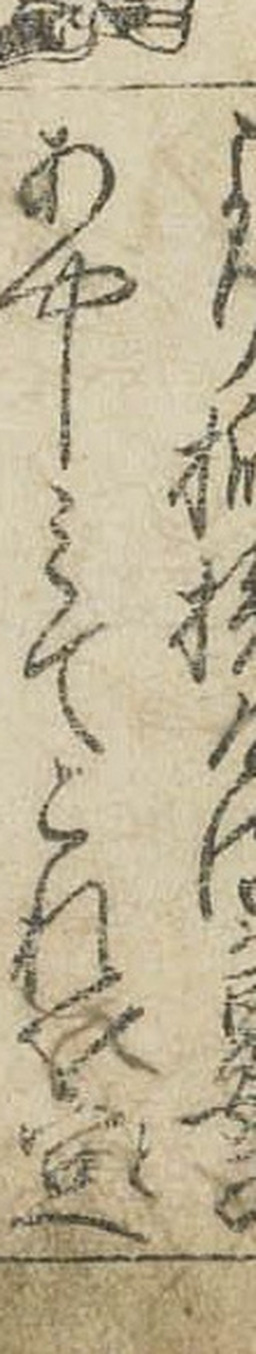あやしみてこれを問へ
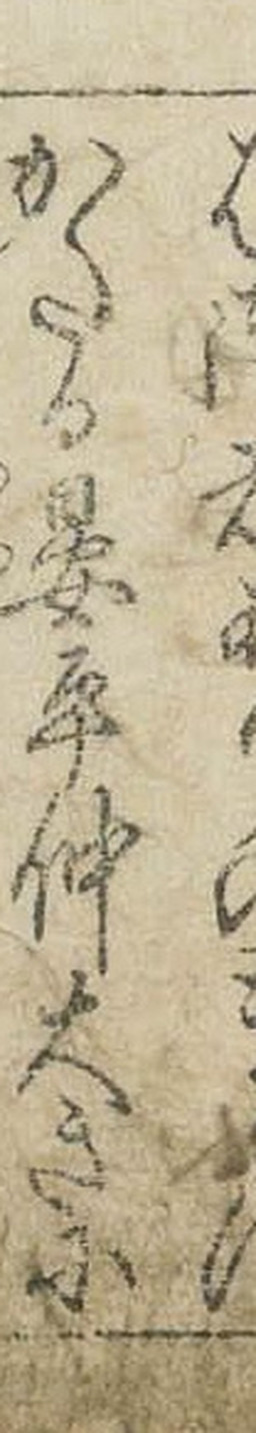かたる晏平仲大きに
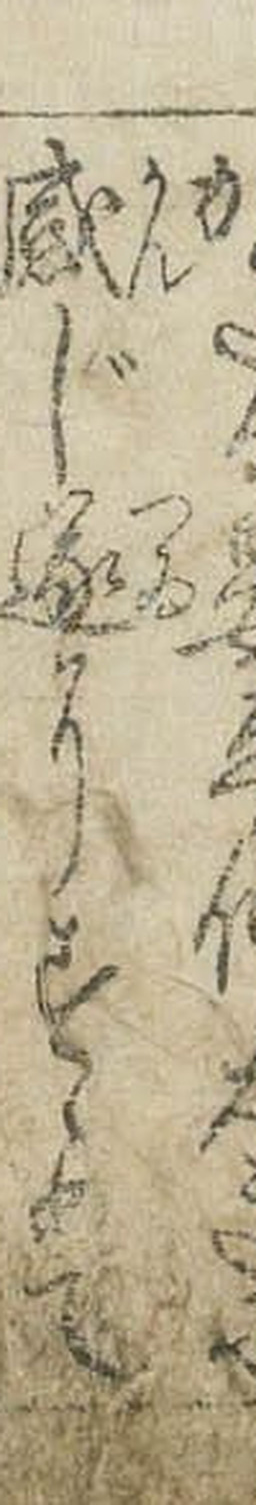感じ遂にすゝめて
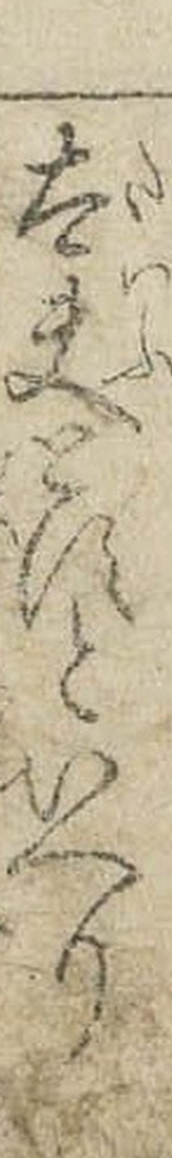太夫とすといへり
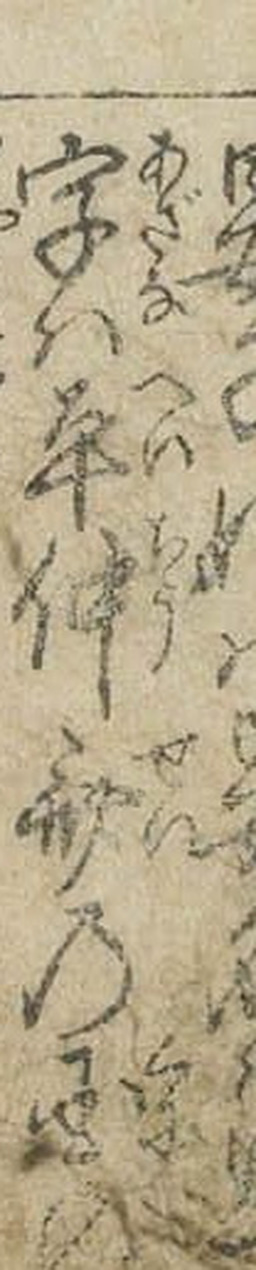字は平仲斉の国の
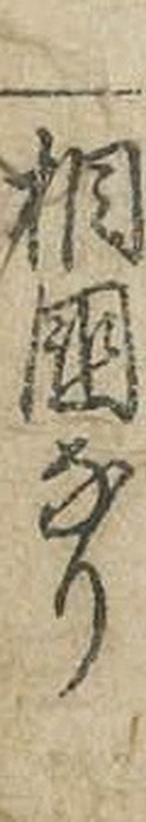相国なり

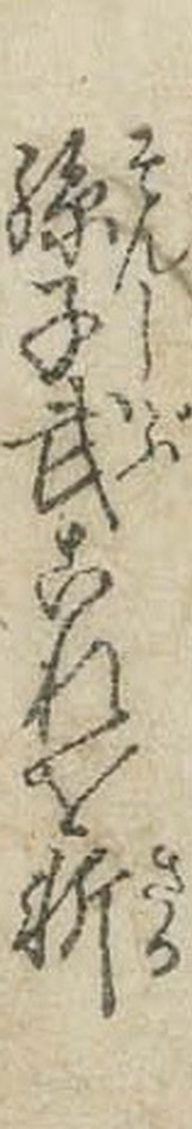孫氏武これを斬
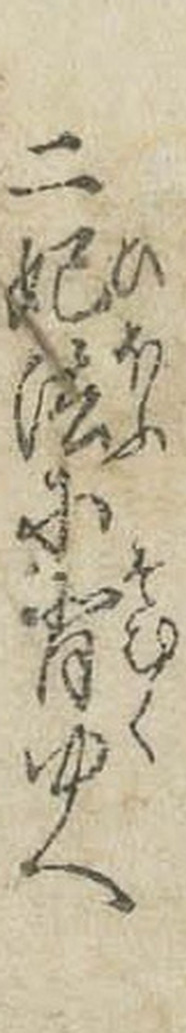二妃法に背ゆへ

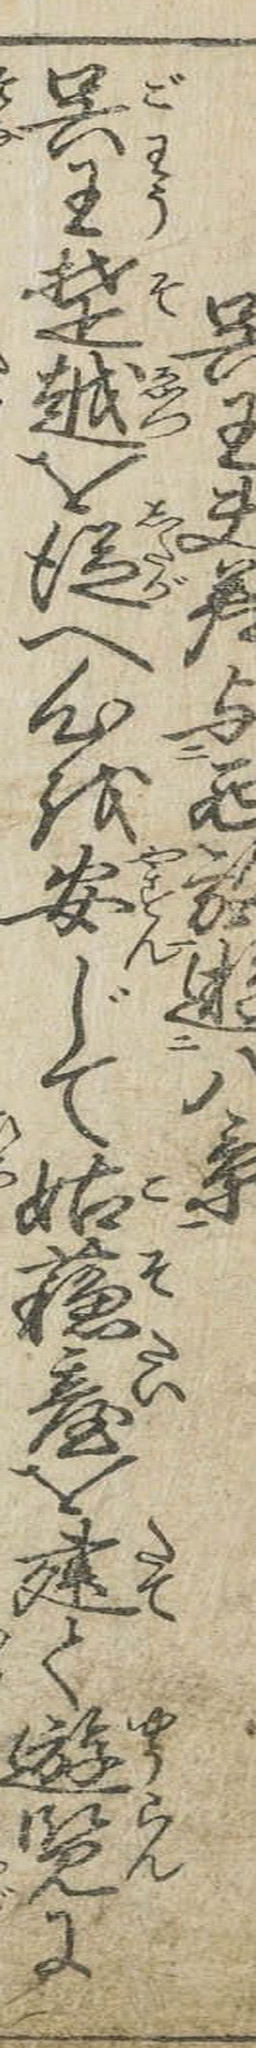呉王楚越を従へ心を安じて姑蘇台を建て遊覧に
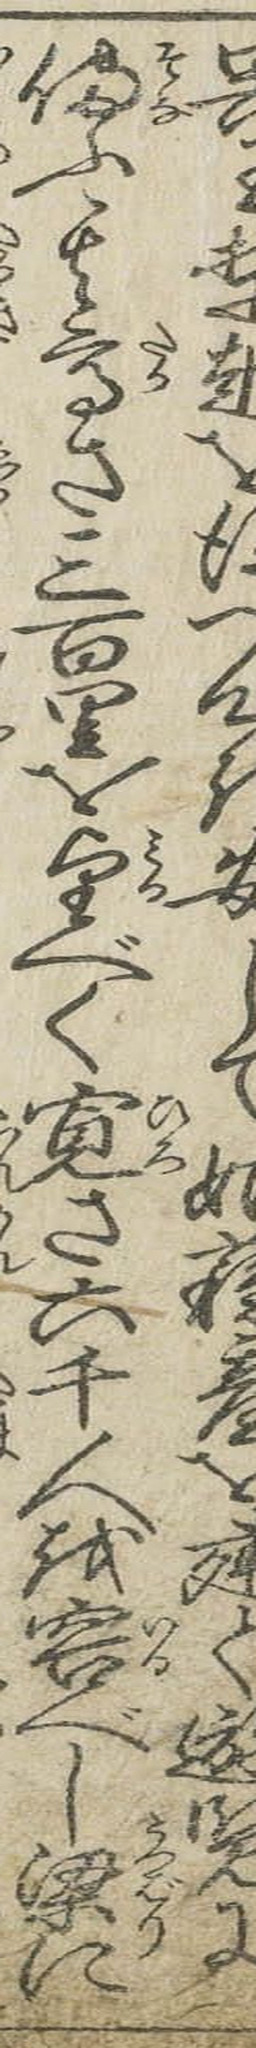備ふ其高さ三百里を望べく寛さ六千人を容べし梁に
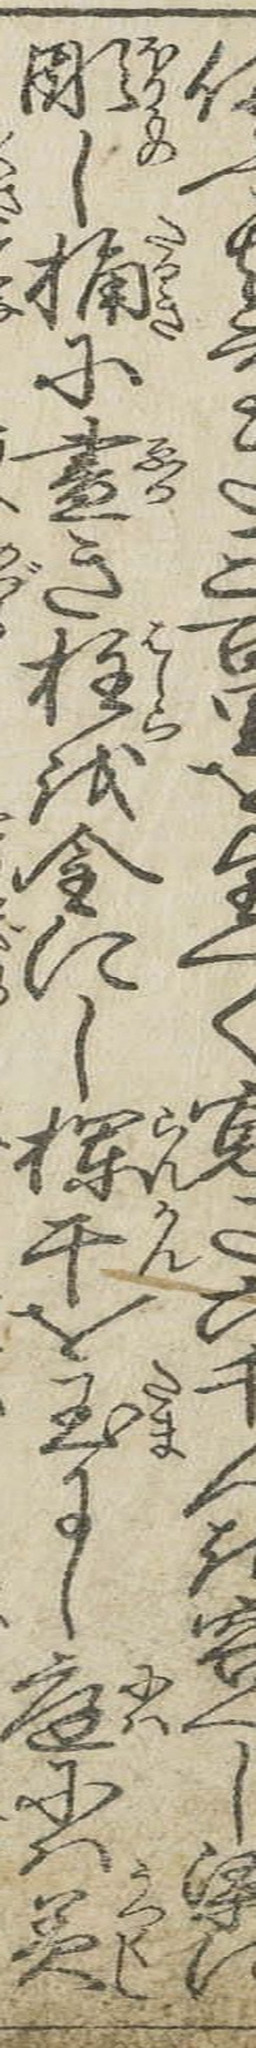彫し桷に画き柱を金にし欄干を玉にし庭には美
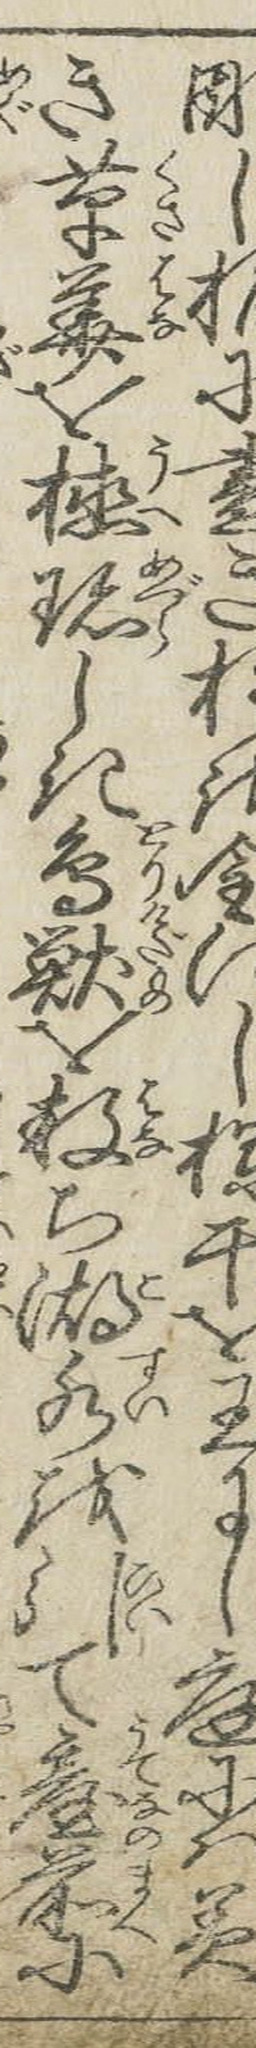き草華を植珍しき鳥獣を放ち湖水を引て台前に
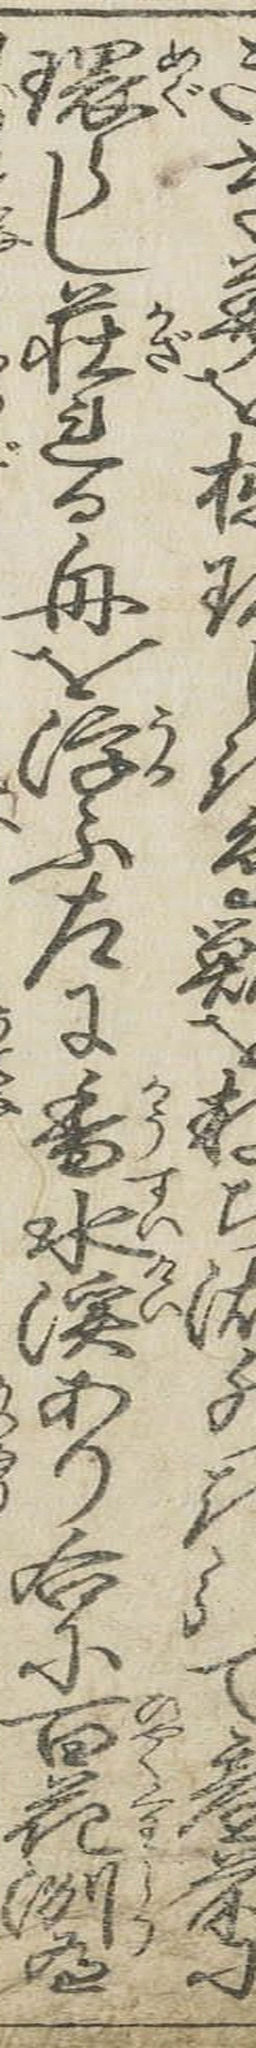環らし荘れる舟を浮ふ左に香水溪あり右に百花洲有
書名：絵本写宝袋 9巻 6之巻
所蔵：東京学芸大学教育コンテンツアーカイブ
